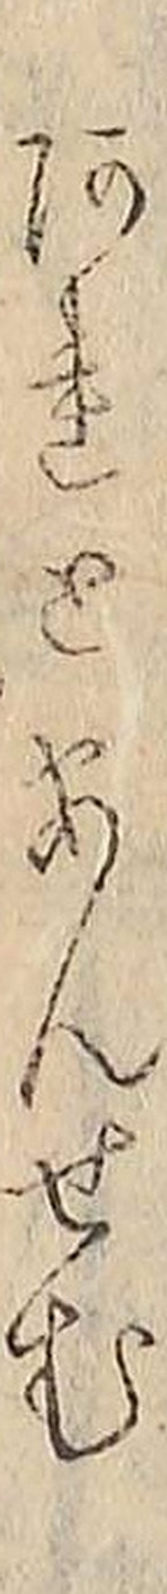あれとあんせむ
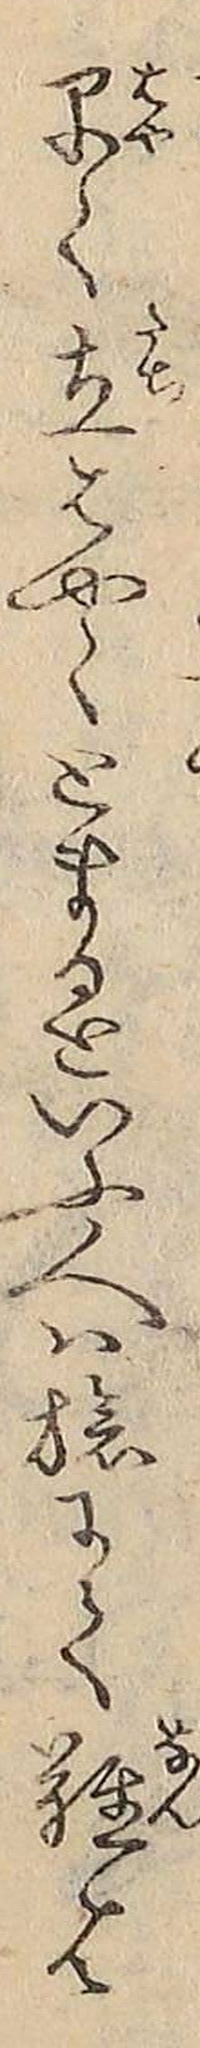早く立はやくとまるといふ人は旅にて難は
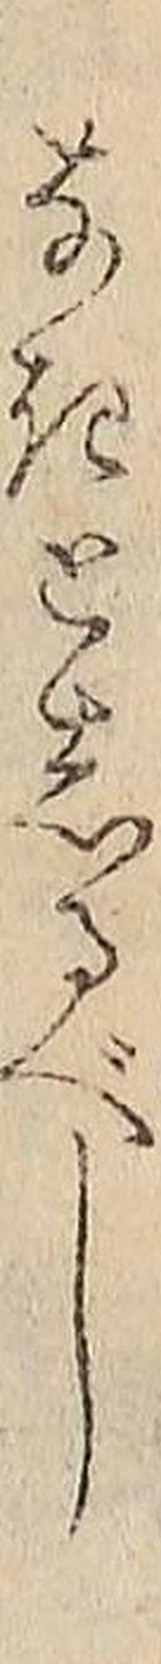なきとしるべし
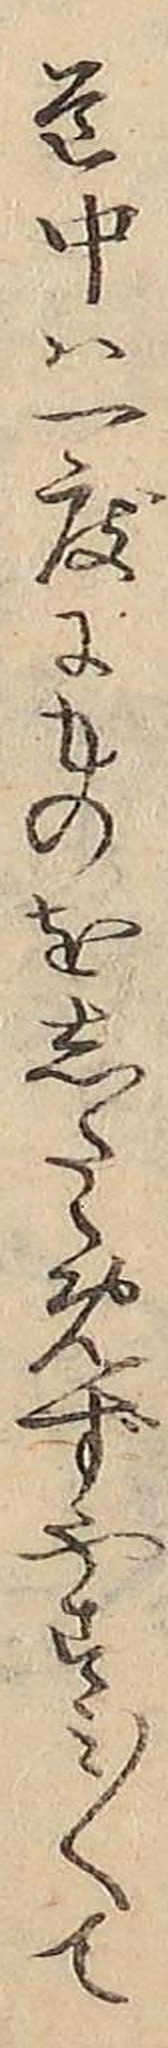道中は一度にものをしたゝめずやすみ〳〵て
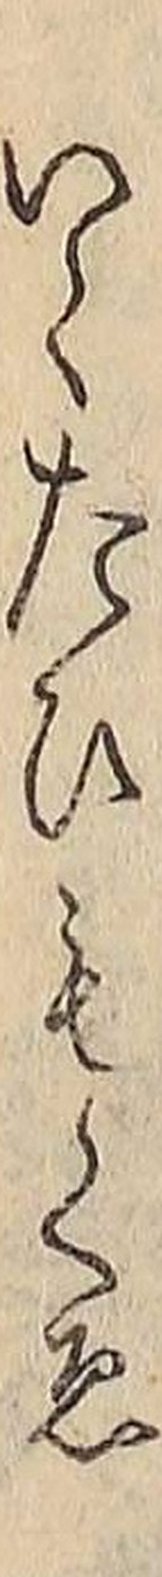いくたひもくゑ
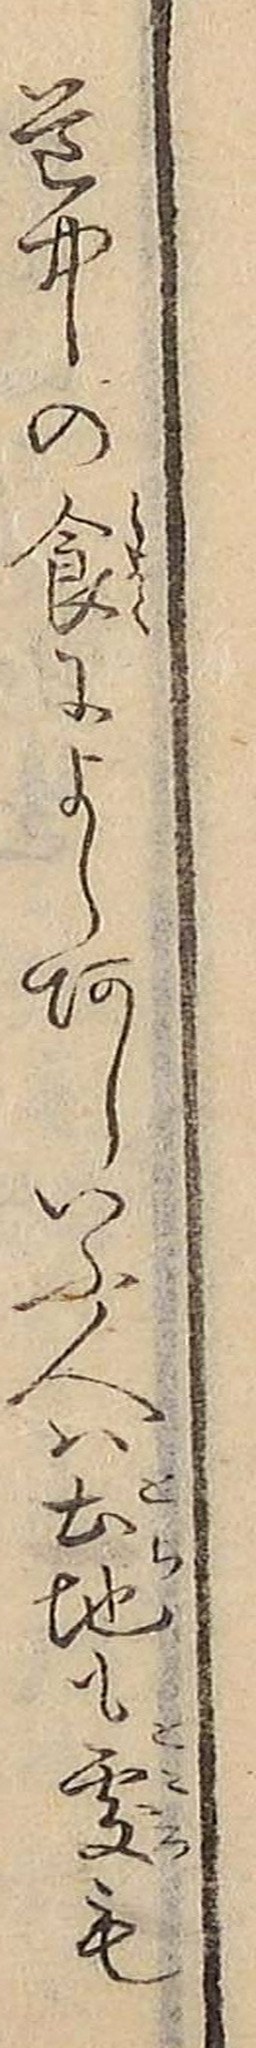道中の食によしあしいふ人は土地も処も
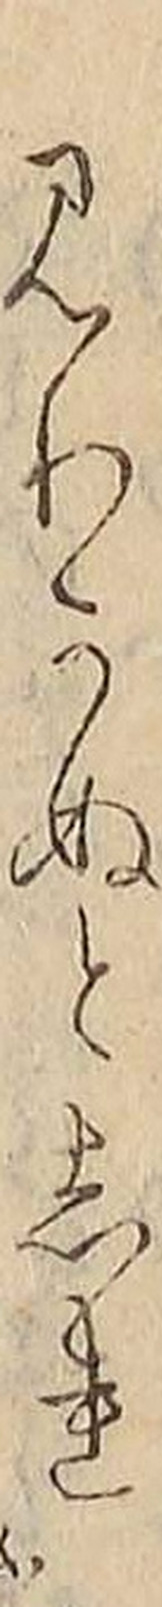見わかぬとしれ
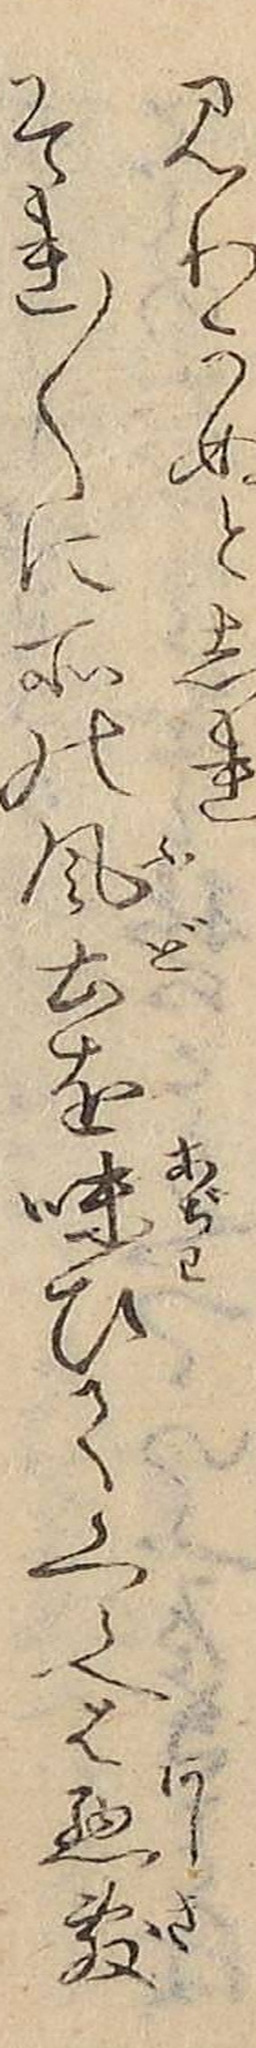それ〳〵に所の風土を味ひてくらへは悪敷
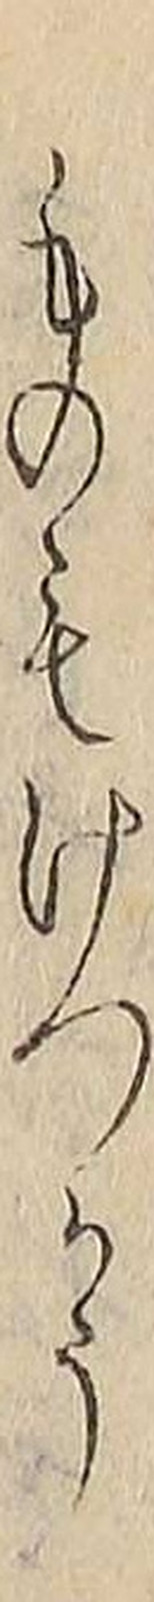ものもけつかう
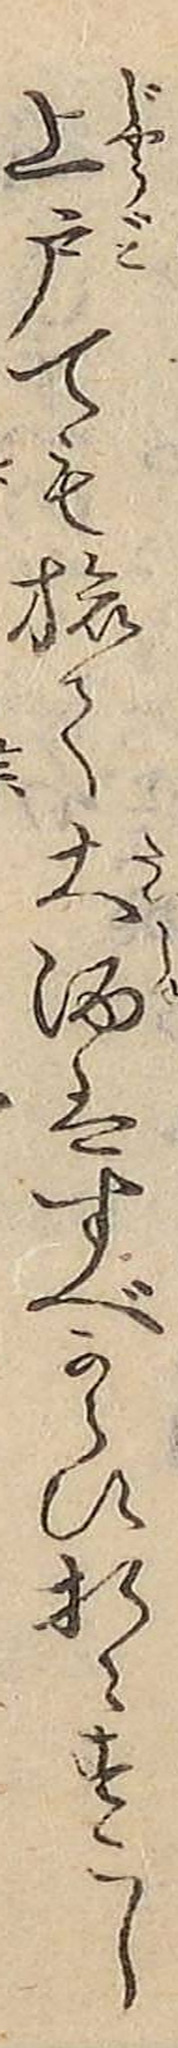上戸ても旅て大酒はすべからす折々すこし
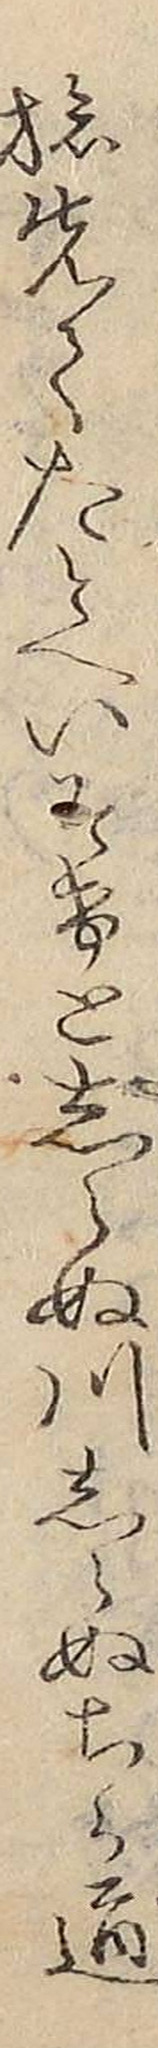旅先てたとへいそけとしらぬ川しらぬちか道
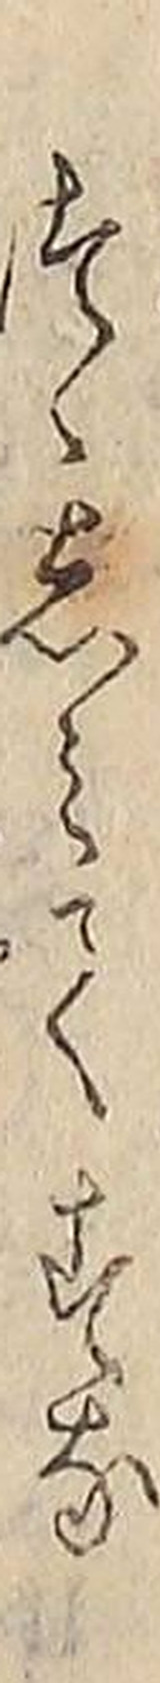つゝしみてすな
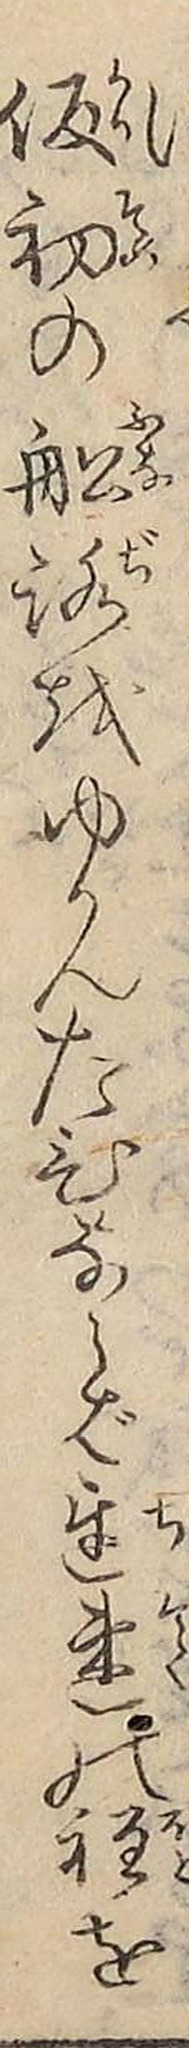仮初の船路をゆかんたひならば遅速の程を
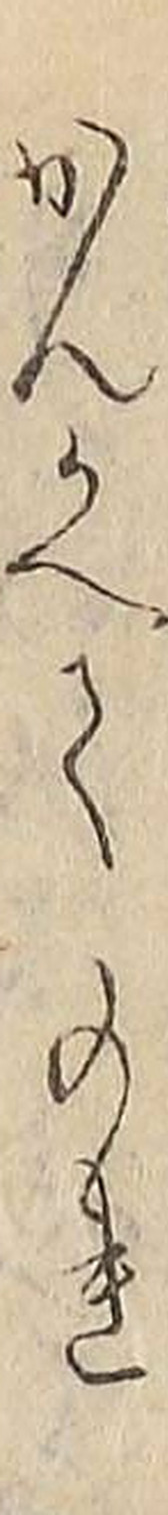かんかへてのれ
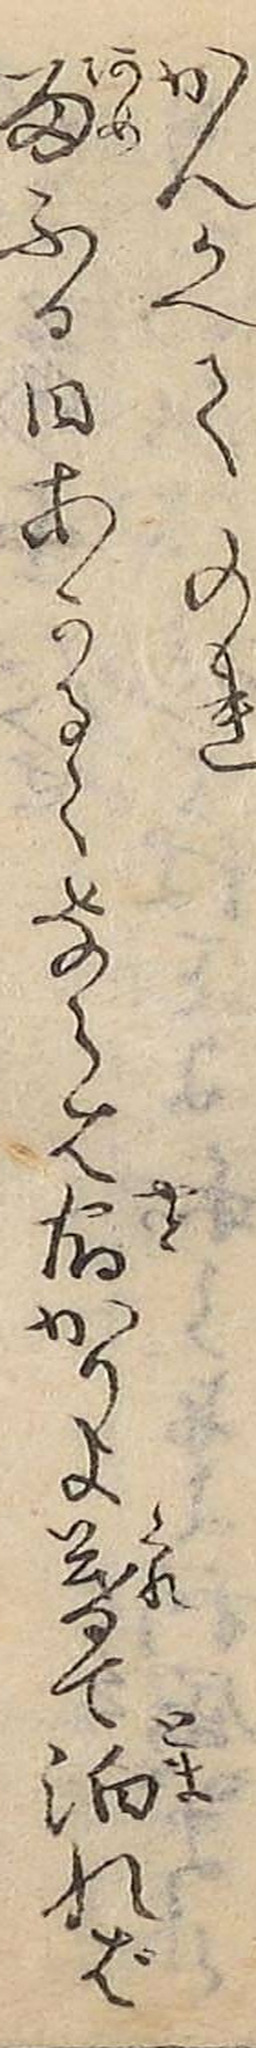雨ふる日あかるくならは宿かりよ暮て泊れば
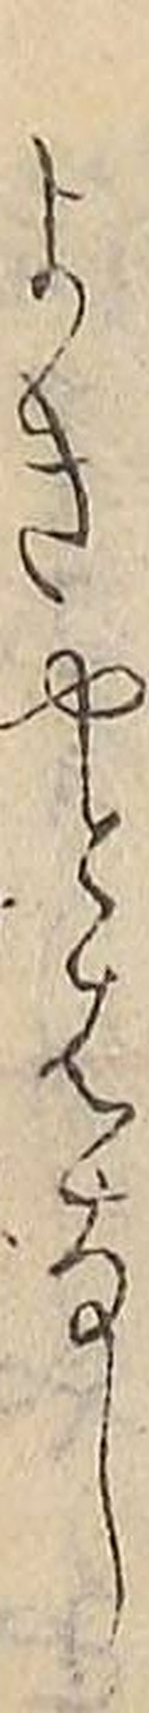よきやとはなし
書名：旅行用心集
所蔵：神戸大学附属図書館 国文学研究資料館
